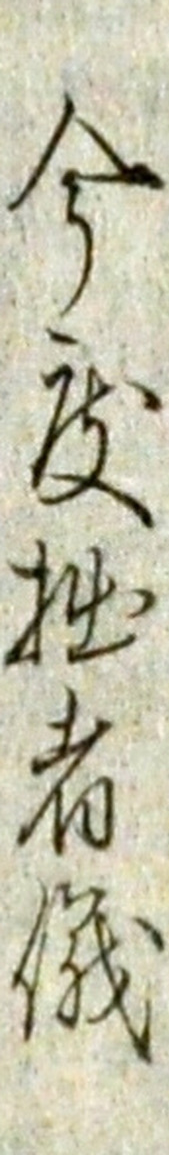今度拙者儀
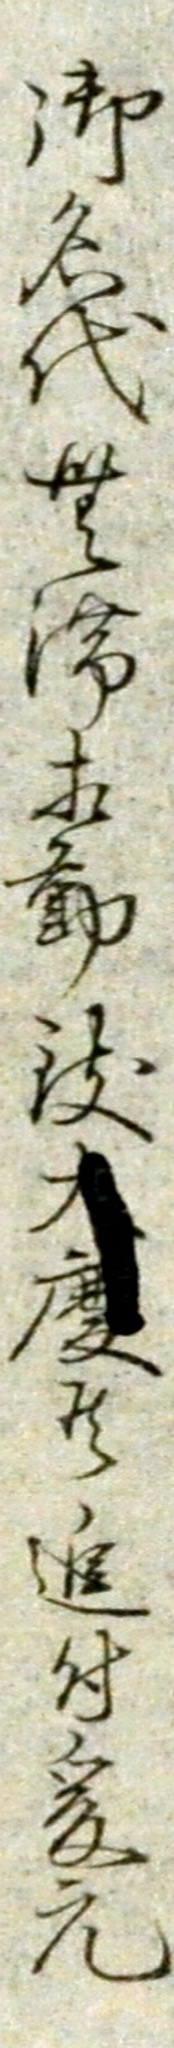御名代無滞相勤致大慶候追付爰元
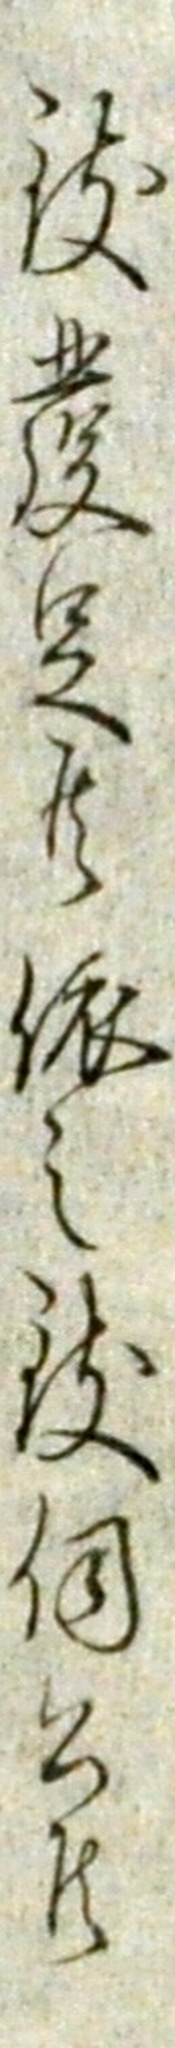致発足候依之致伺公候

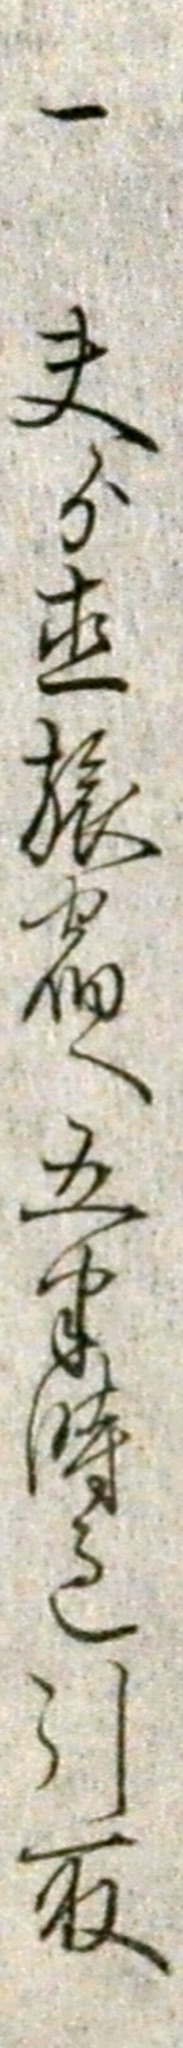一夫ゟ直旅宿へ五半時過引取
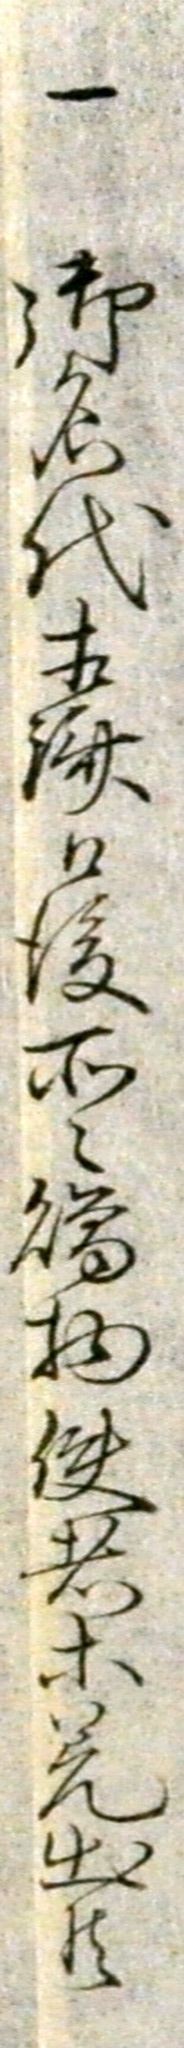一御名代相済候後所々贈物使者等差出共
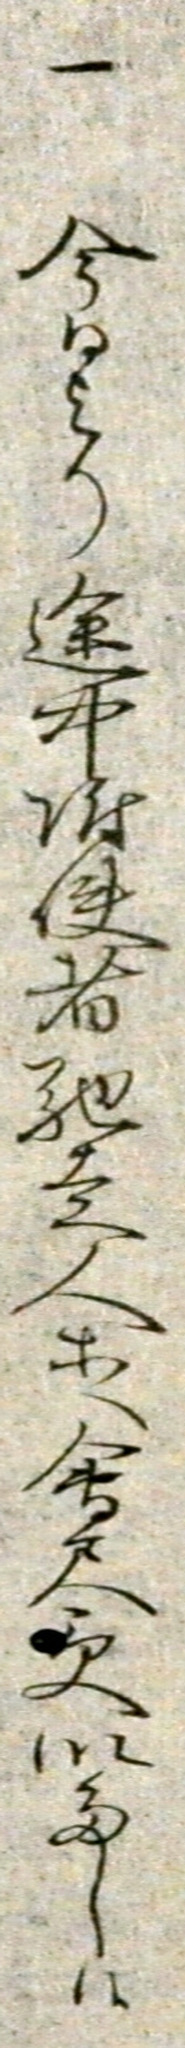一今日より途中附使者馳走人等へ会尺受いたし候
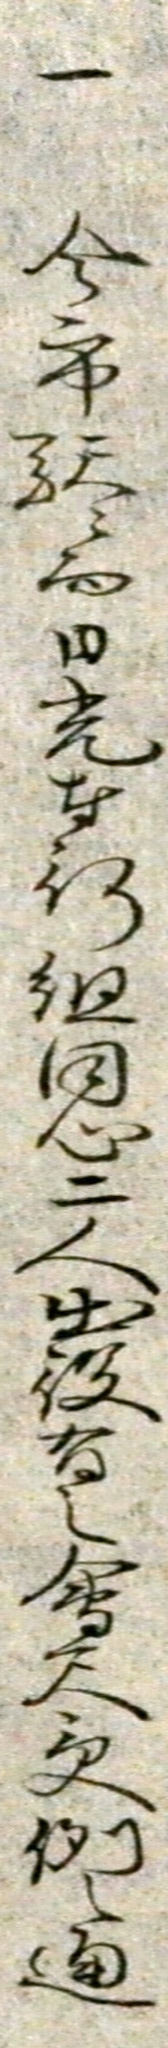一今市駅ニ而日光奉行組同心二人出役有之会尺受例之通
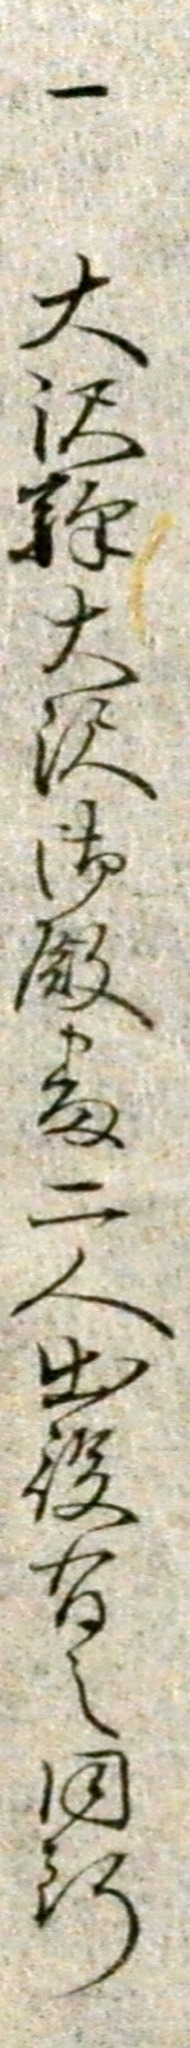一大沢駅大沢御殿番二人出役有之同断
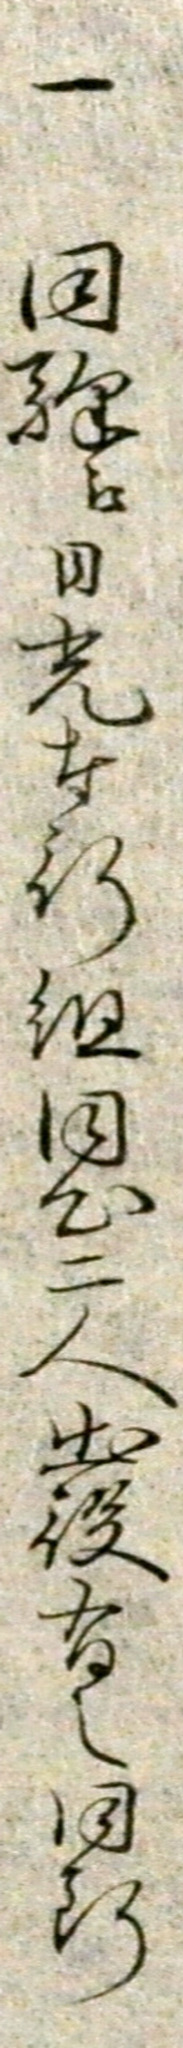一同駅江日光奉行組同心二人出役有之同断
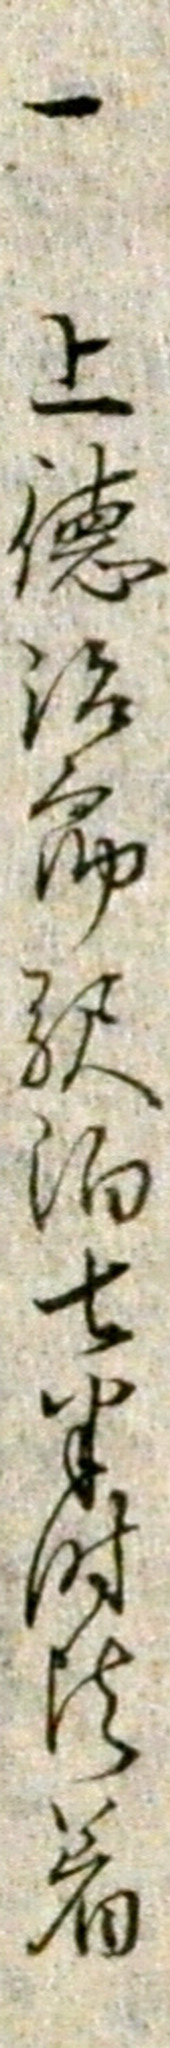一上徳治郎駅泊七半時頃着
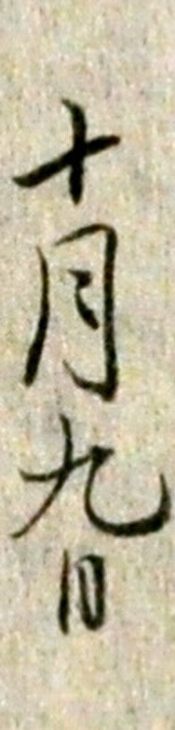十月九日
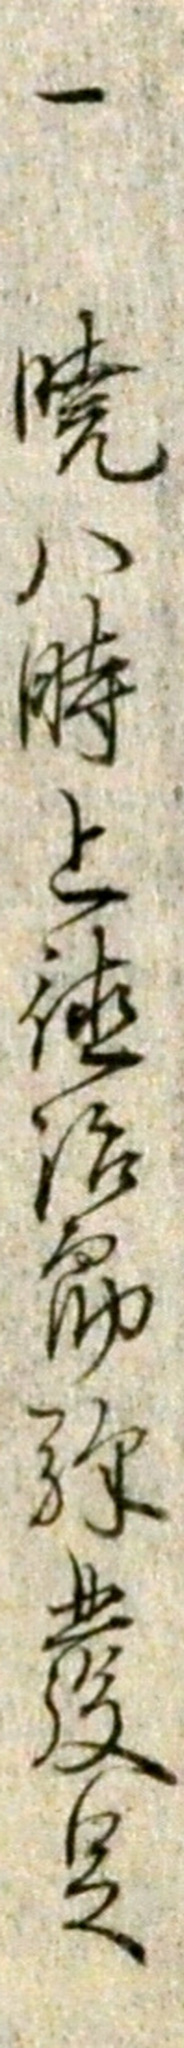一暁八時近徳治郎駅発足
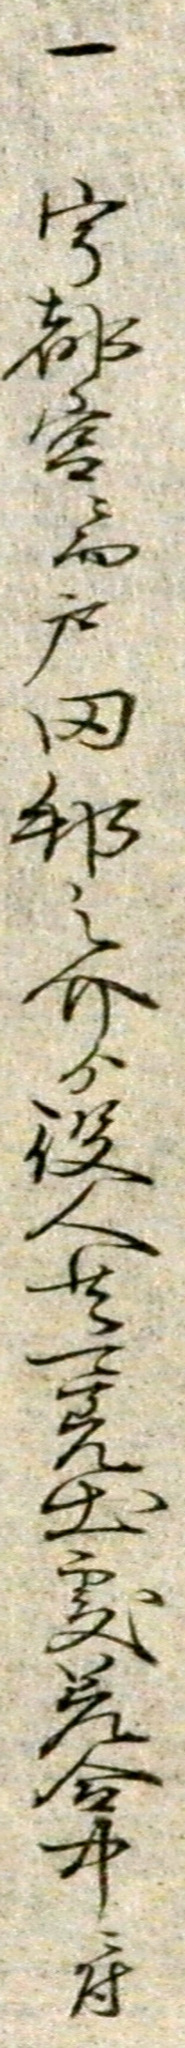一宇都宮ニ而戸田邦之介ゟ役人共可差出処差合中ニ付
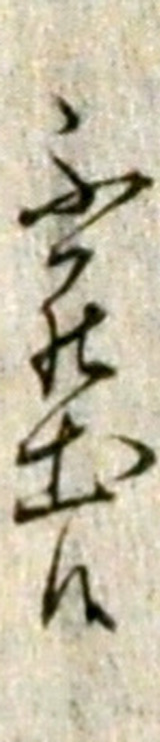不罷出候
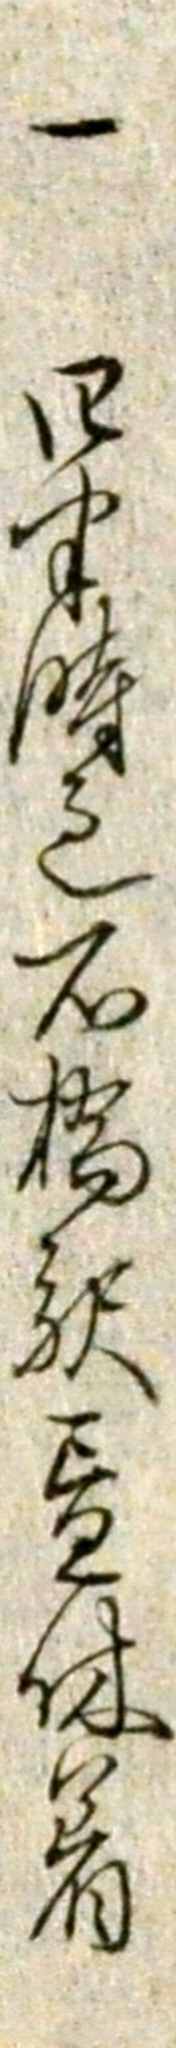一四半時過石橋駅昼休着
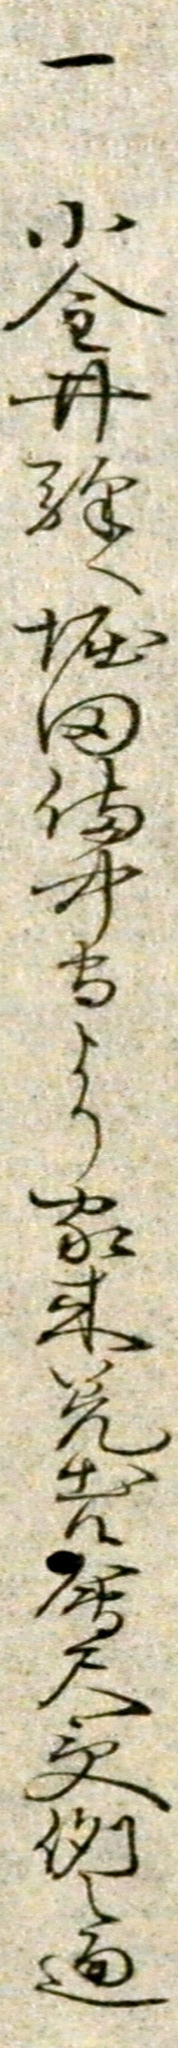一小金井駅へ堀田備中守より家来差出候会尺受例之通
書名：日光御名代相勤候節ノ留
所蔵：伊那市立高遠町図書館・合同会社AMANE
